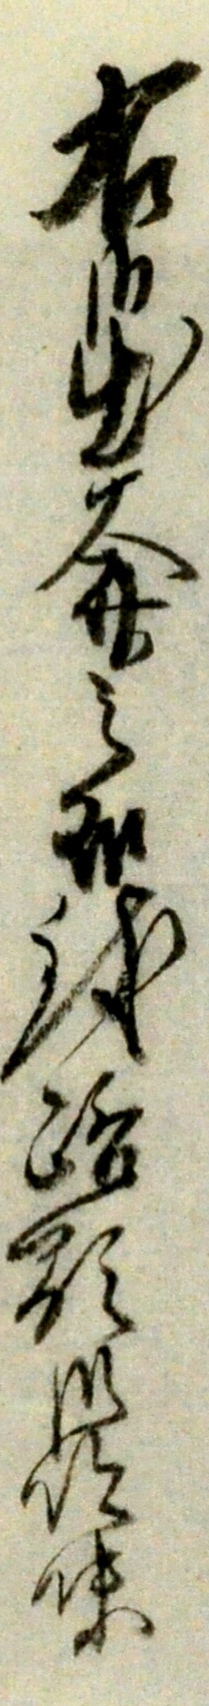右御出奔之処致路顕御吟味
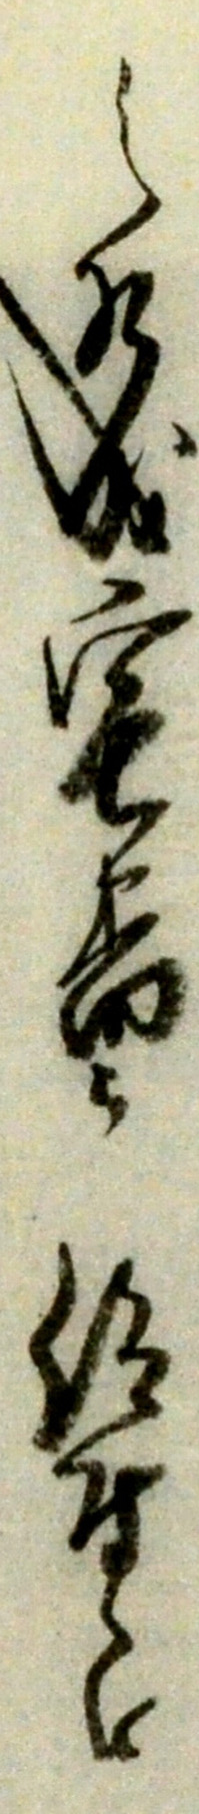に相成宅番被仰出候由
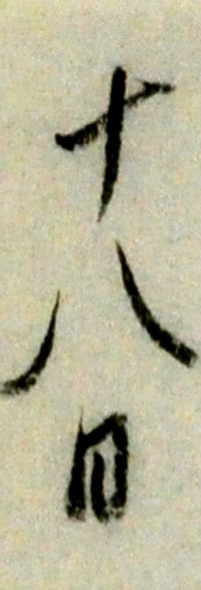十八日
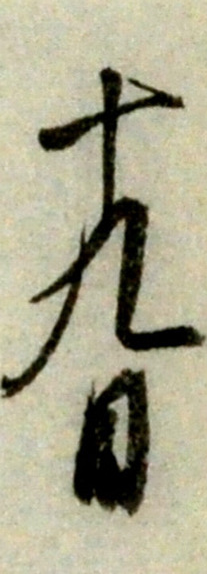十九日
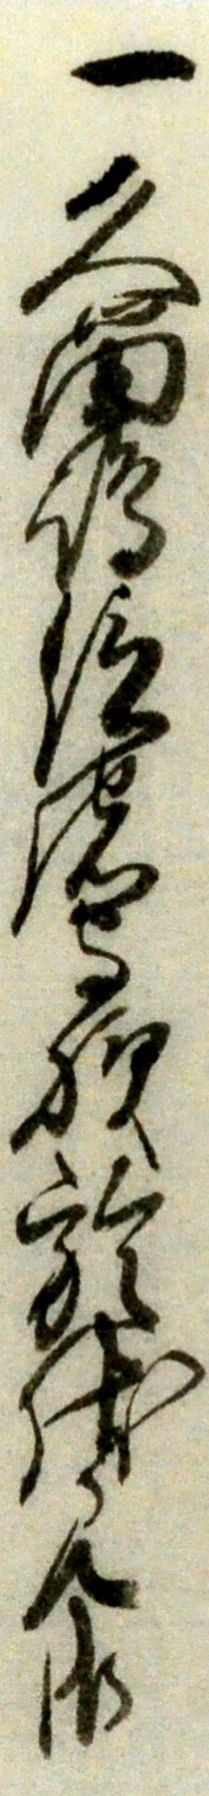一久留島信濃守様於伏見御
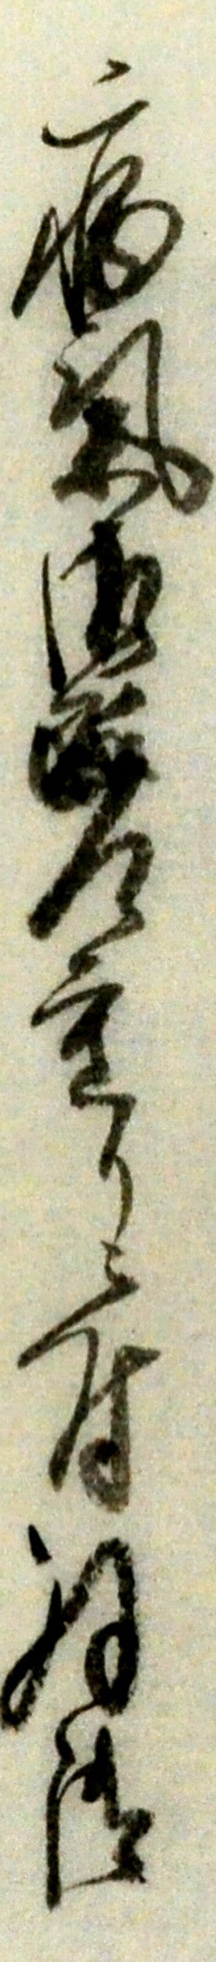病気御差重りに付為御
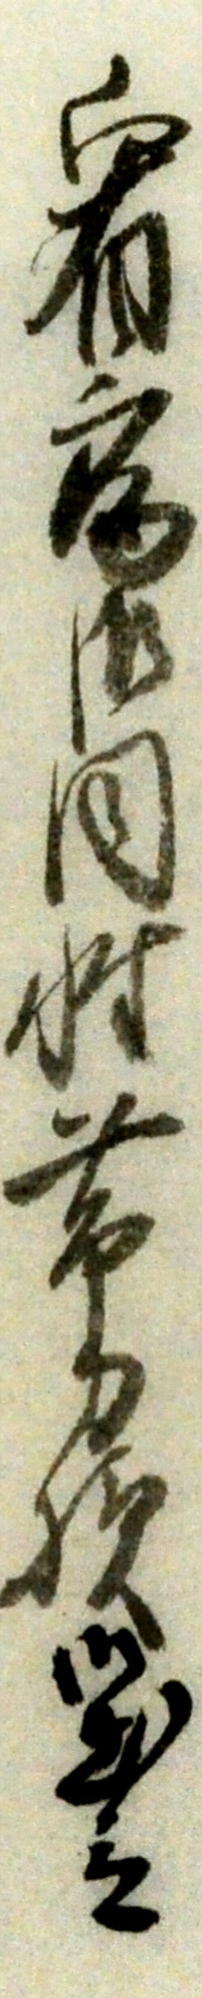看病御同性帯刀様御出立
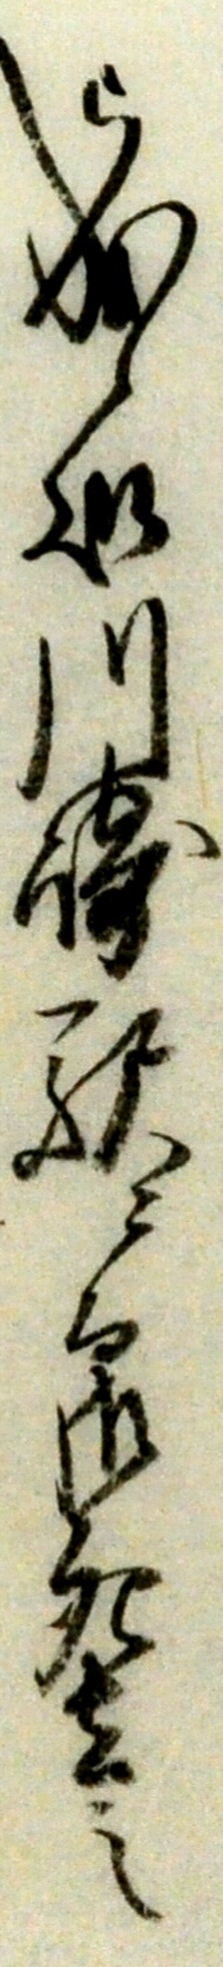被成候処川崎駅にて御死去之
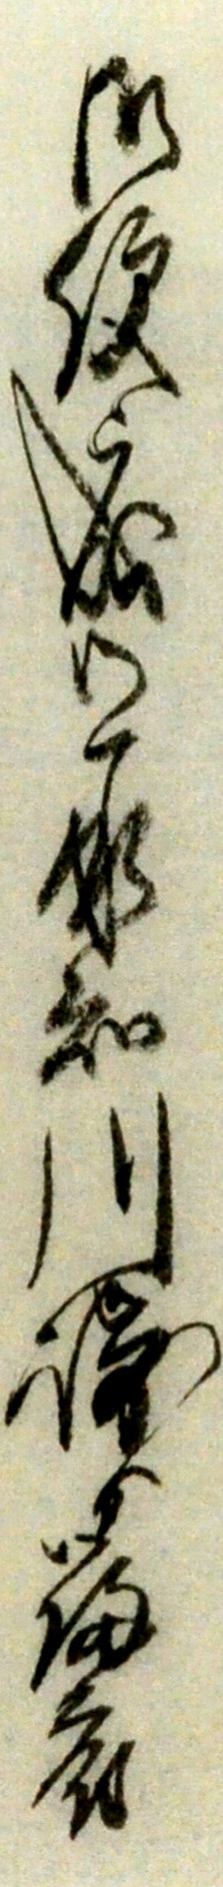御便被成御承知川崎ゟ帰府
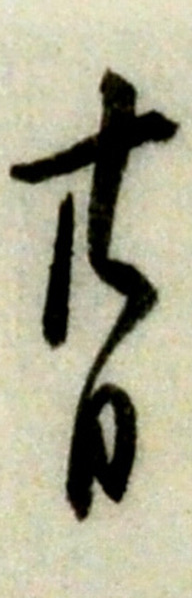十八日

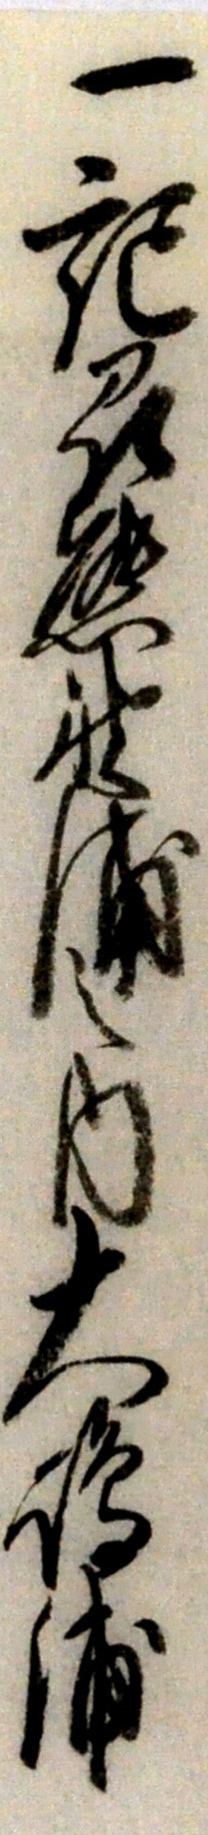一紀州熊野浦之内大嶋浦
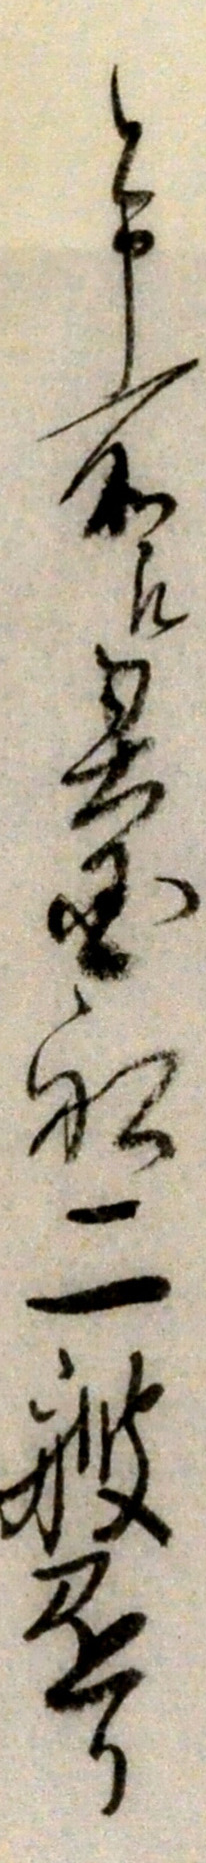と申所え異国船二艘懸り
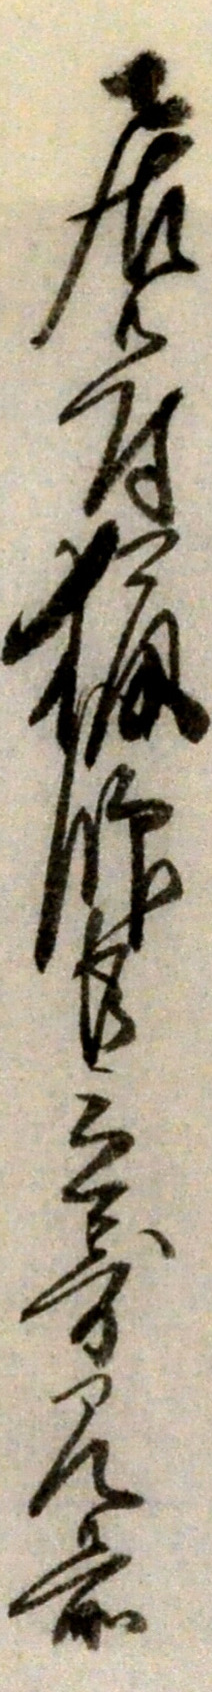居候付猟師共立寄見候所
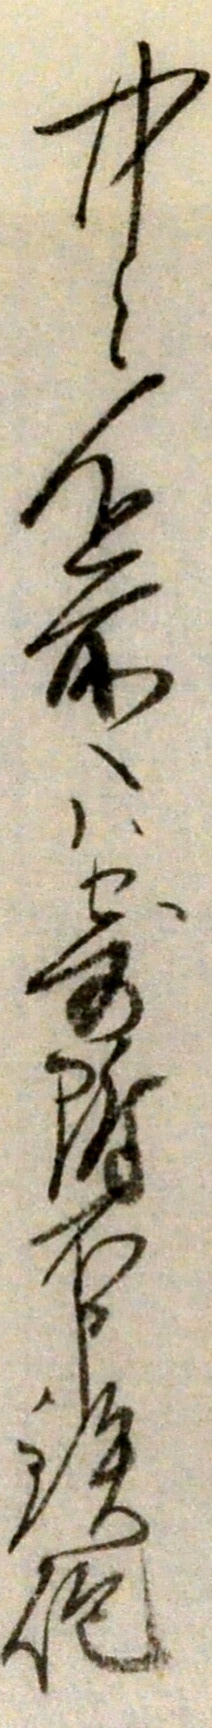中々近所へは寄附不申鉄砲
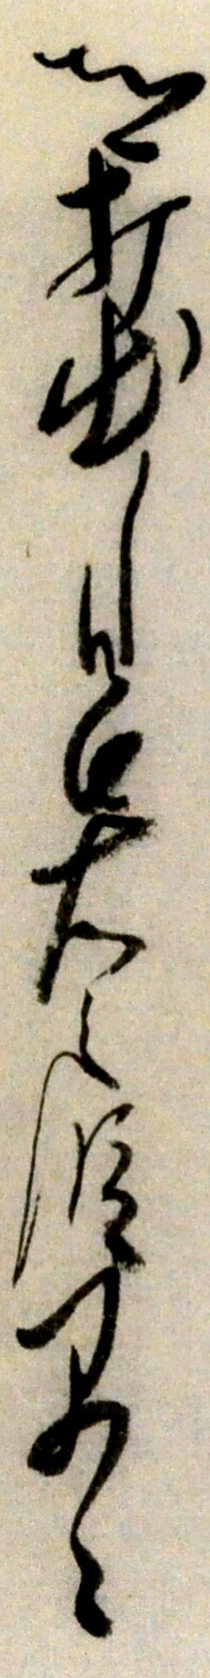を打出し候由右之段早々
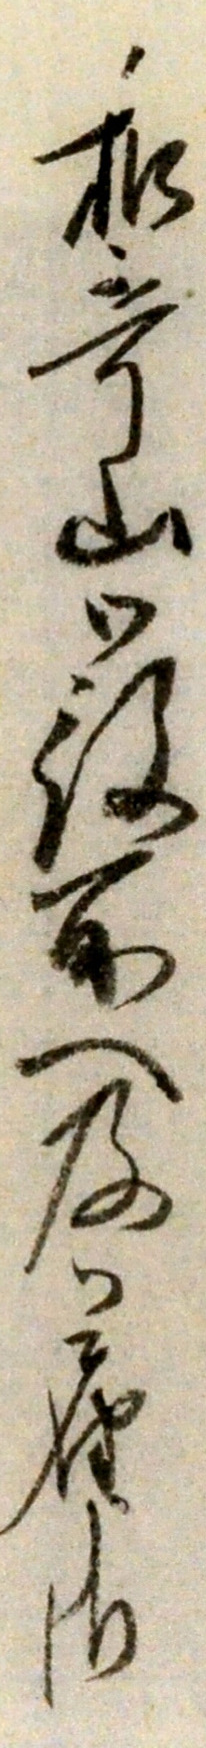和歌山御役所へ及御届御
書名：申合帳〔一括〕
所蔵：伊那市立高遠町図書館・合同会社AMANE
